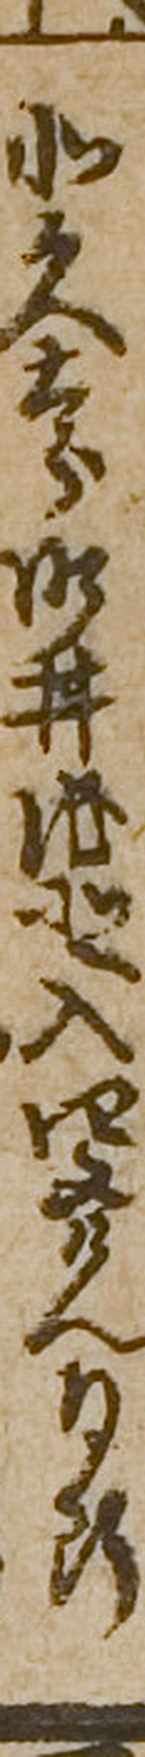北久太郎町丼池北へ入四五けん同断
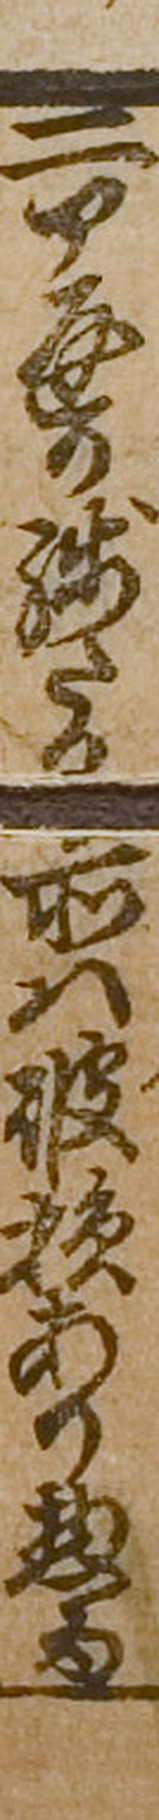二部通り残たる所ハ破損あり惣而
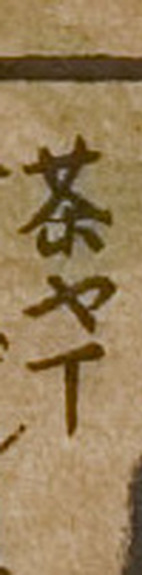茶ヤ丁
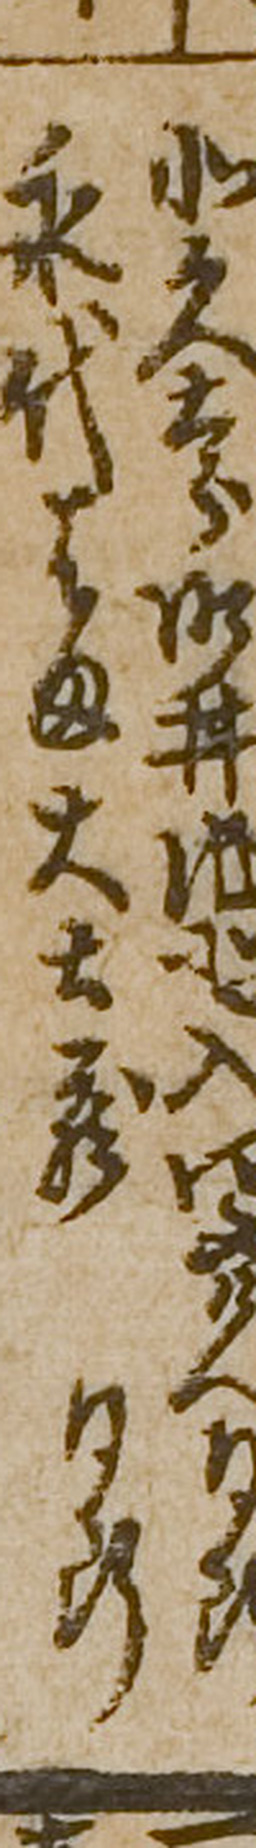永代はま大土蔵同断
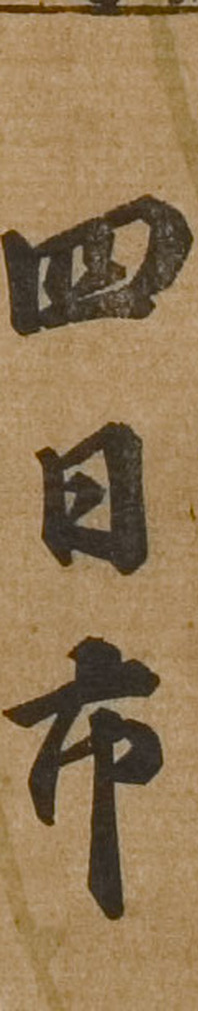四日市
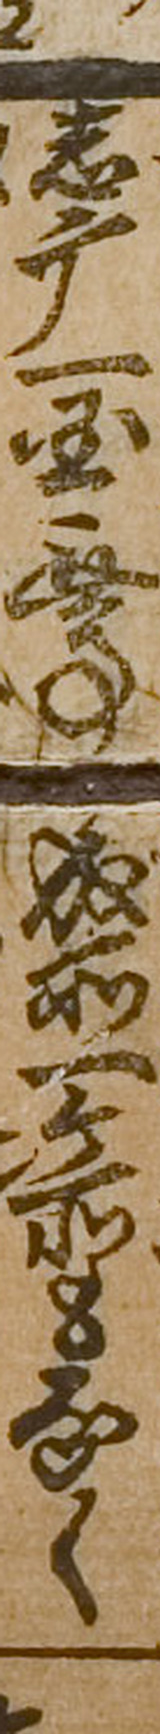志摩一国無事成所一ケ所もなく
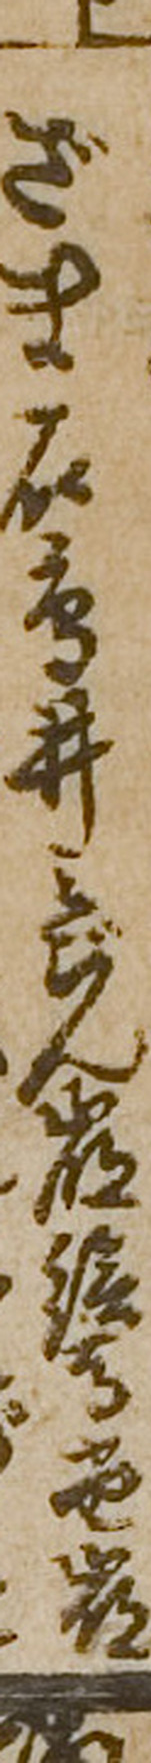ざま石鳥井みぢん崩絵馬堂崩
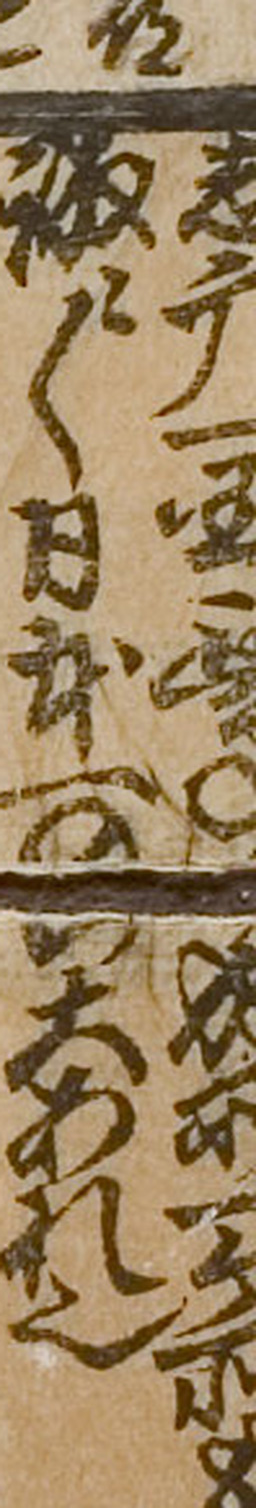誠ニ〳〵日本一の大あれ也
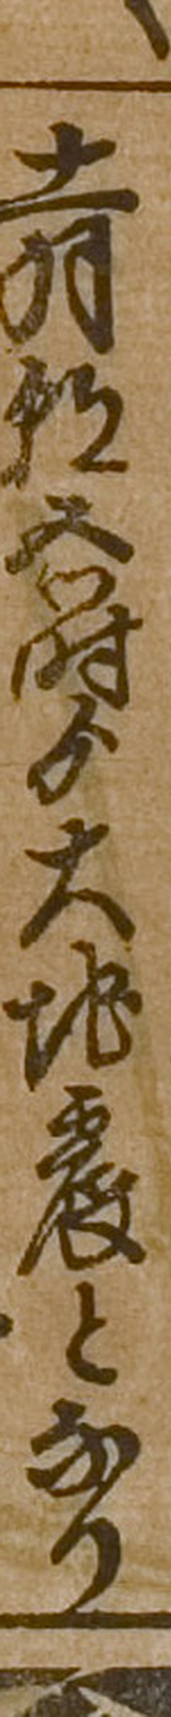十一月朝五ツ時ゟ大地震となり
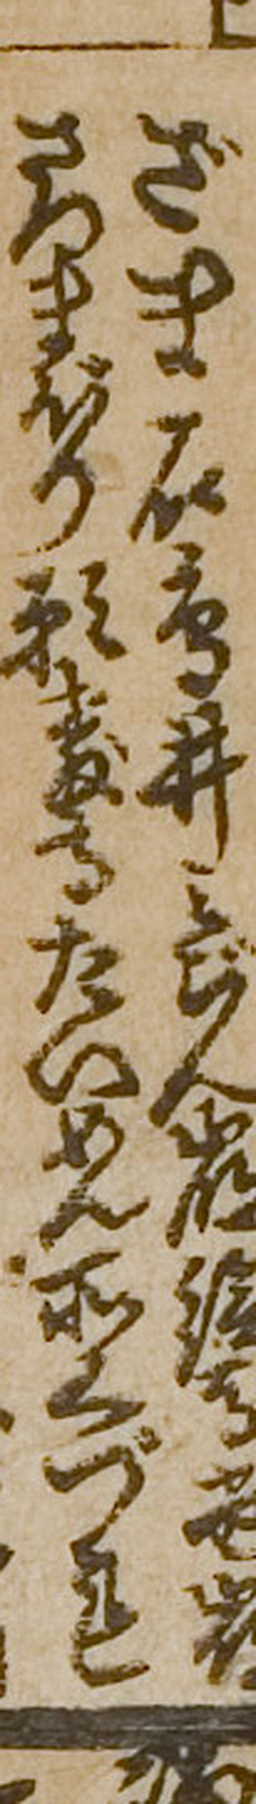さつまぼり願教寺たいめん所くづれ
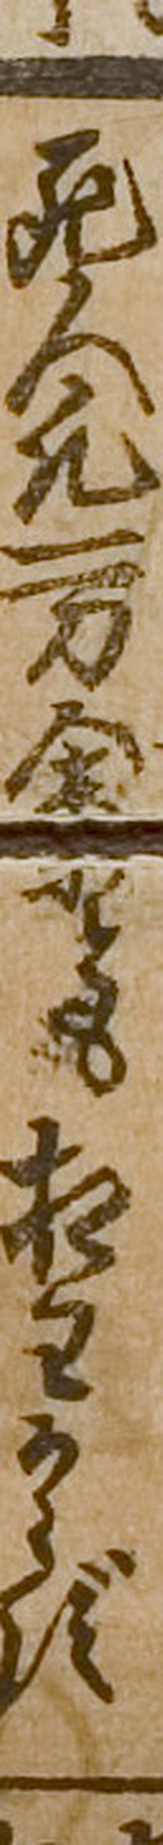死人凡一万余とも相わからず
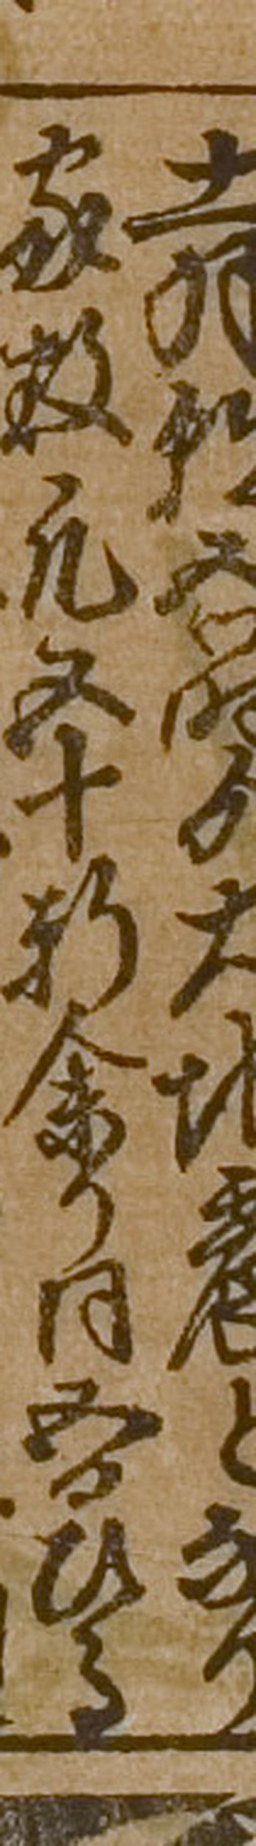家数凡五十軒余り同五日ひる
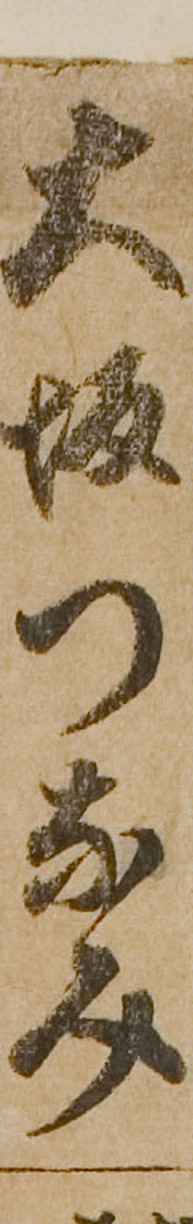大坂つなみ
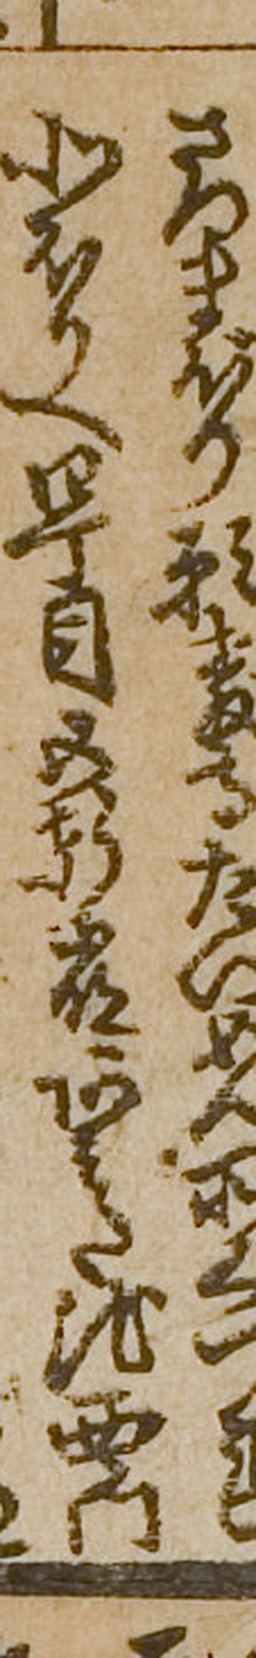北ほりへ四丁目五軒崩あみた池西門
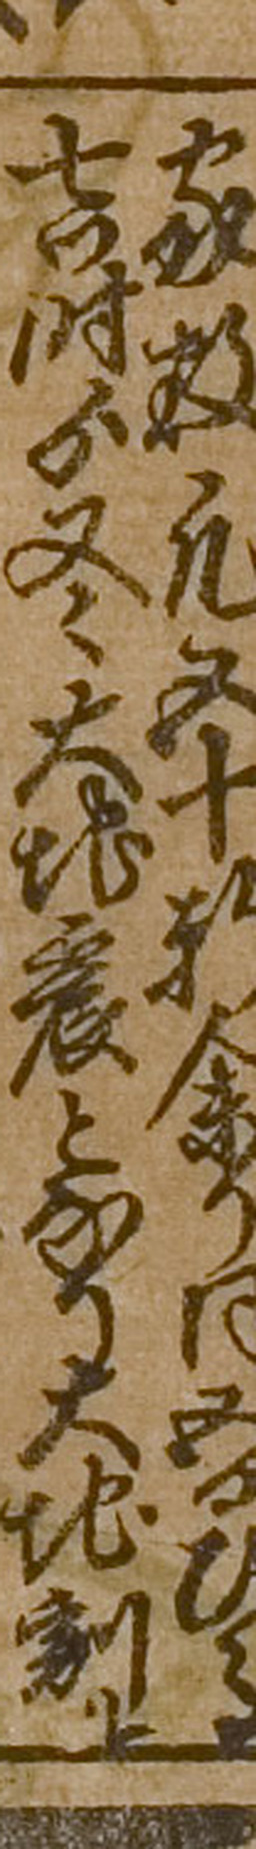七ツ時ゟ又々大地震となり大地割レ
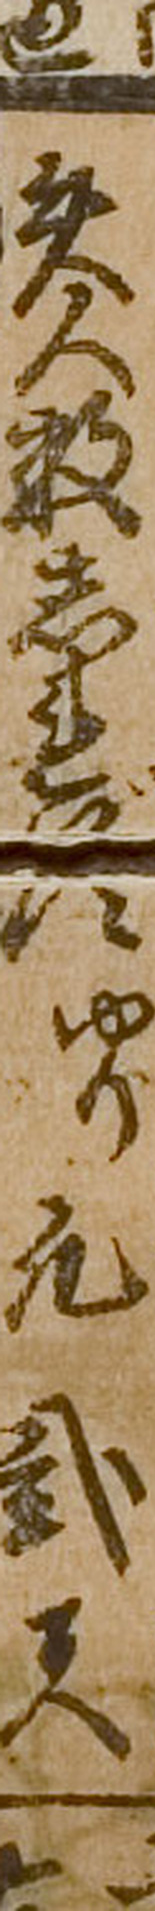失人数知れずゆり凡弐尺
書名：[大坂つなみ]
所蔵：東京大学総合図書館 General Library in the University of Tokyo, JAPAN
